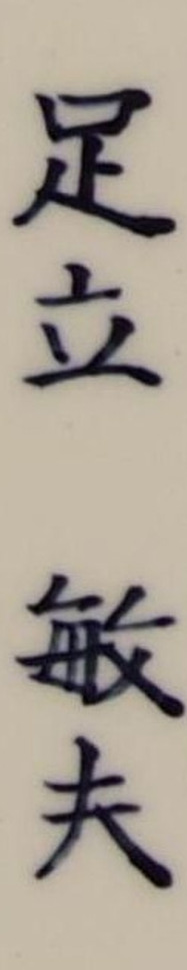足立敏夫
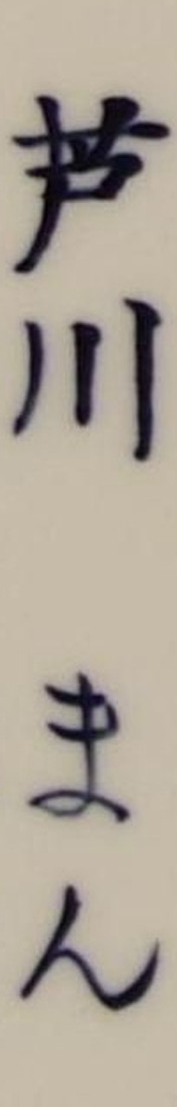芦川まん
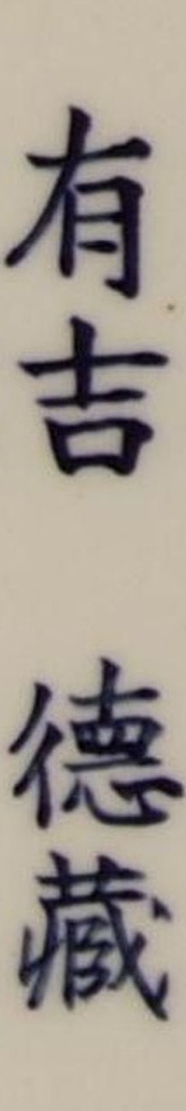有吉徳蔵
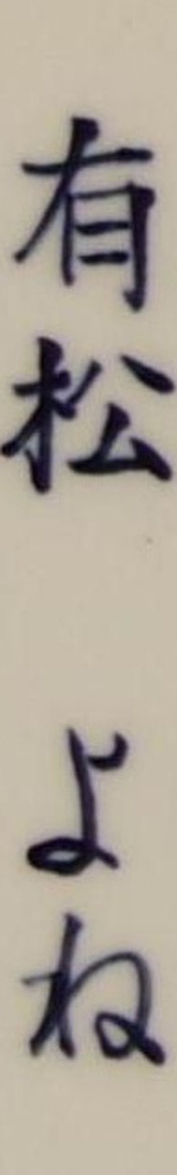有松よね
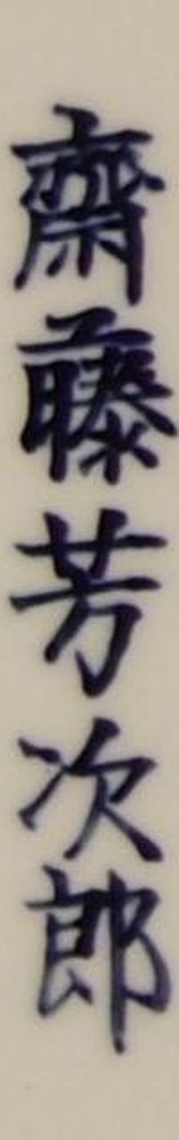斉藤芳次郎

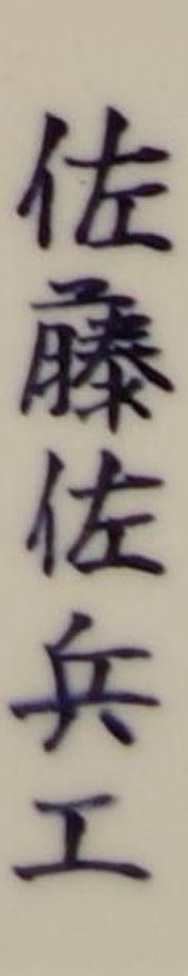佐藤佐兵エ
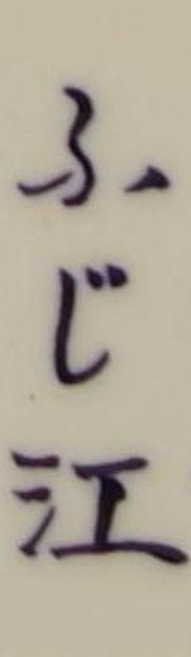ふじえ
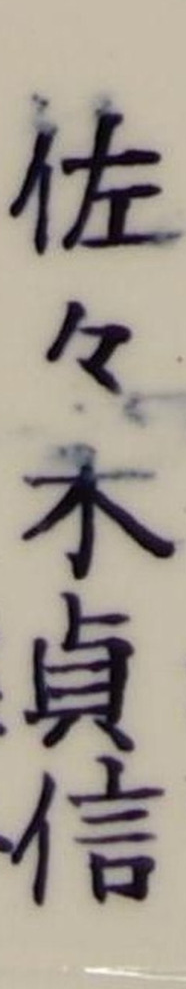佐々木貞信
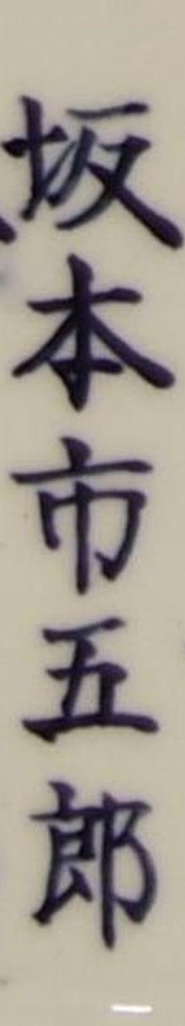坂本市五郎
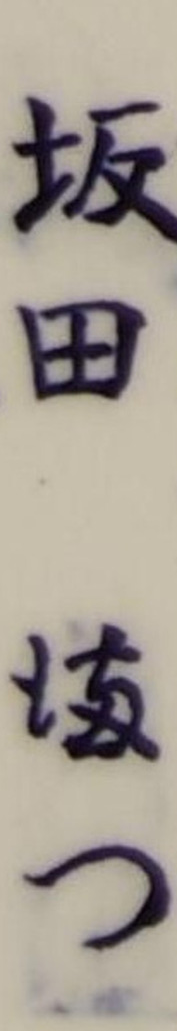坂田みつ
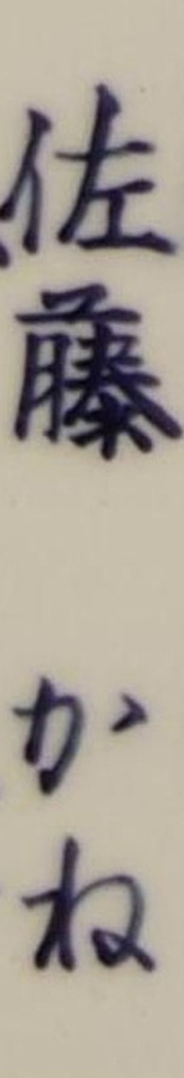佐藤かね
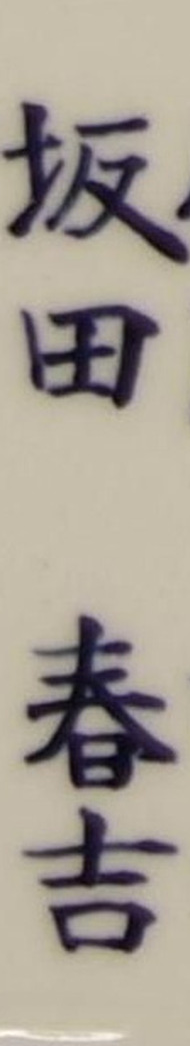坂田春吉

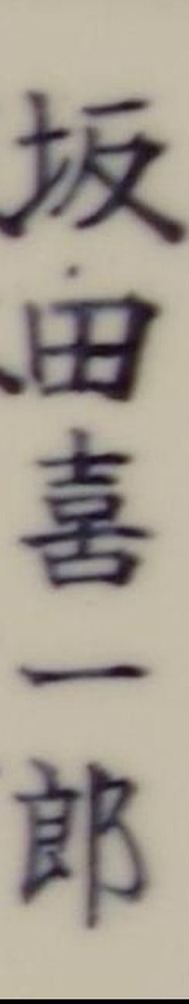坂田喜一郎
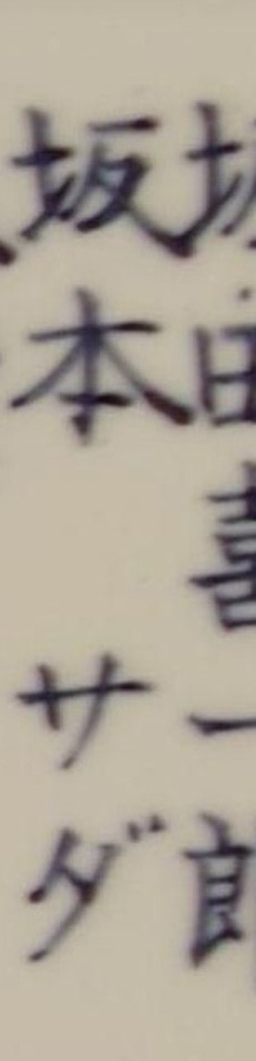坂本サダ
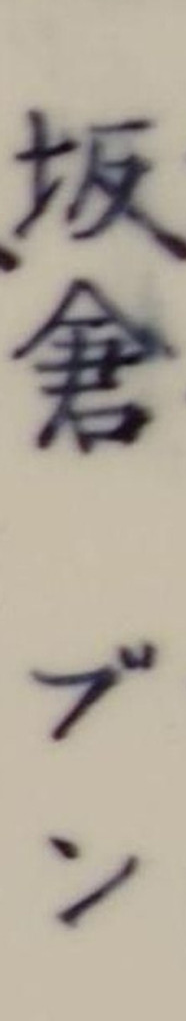坂倉ブン
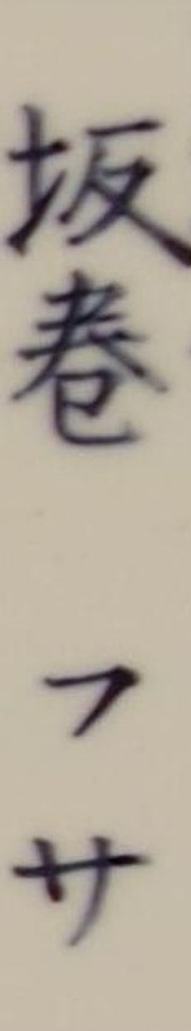坂巻フサ
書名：E~L
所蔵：高野山金剛峯寺
